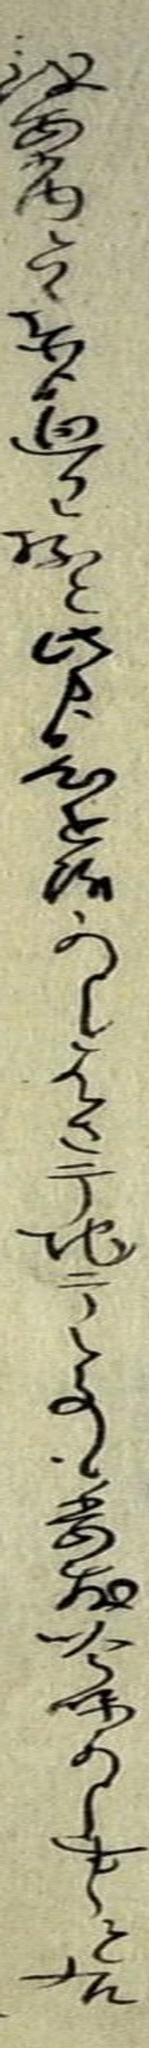致案内候ハヽ東ゟ廻り候なと此方ゟ心を付可申候はさ干地干之事も委敷吟味可申聞事ニ候右
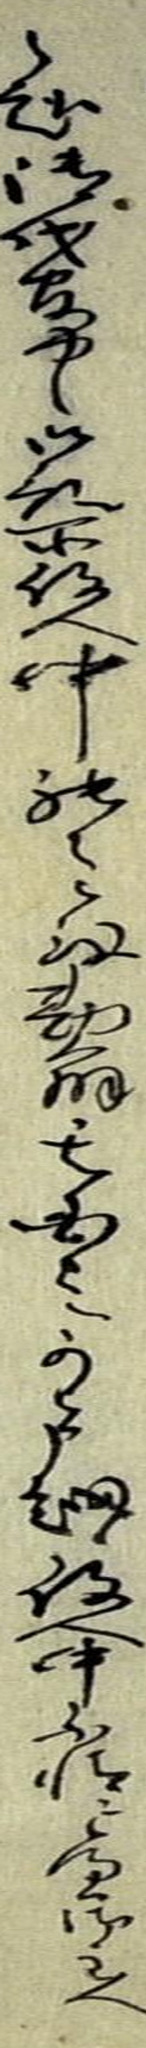之趣御代官中御預所役人中能々被致勘弁其国々へ可被申越候役人中不情ニ候得ハ御主人
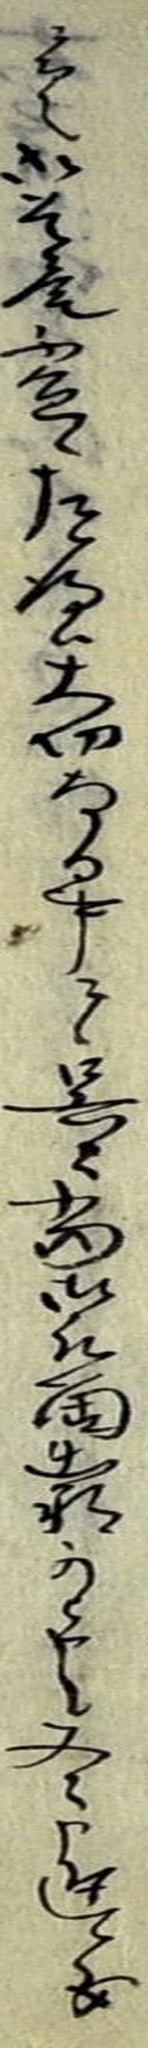ニ而之御首尾不宜候左候得ハ大切なる中ニ候呉々当御取箇出精可被申候又々申達候義
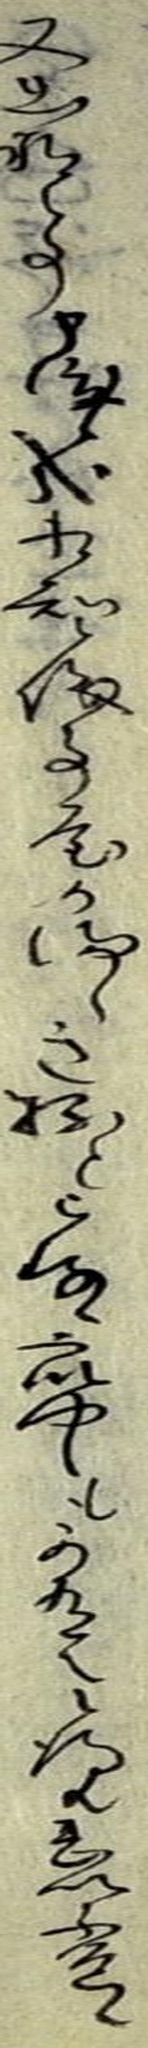又出水之事申渡候哉相知候儀事やかましき抔と被存候衆中も可有之候得共甚以不宜候
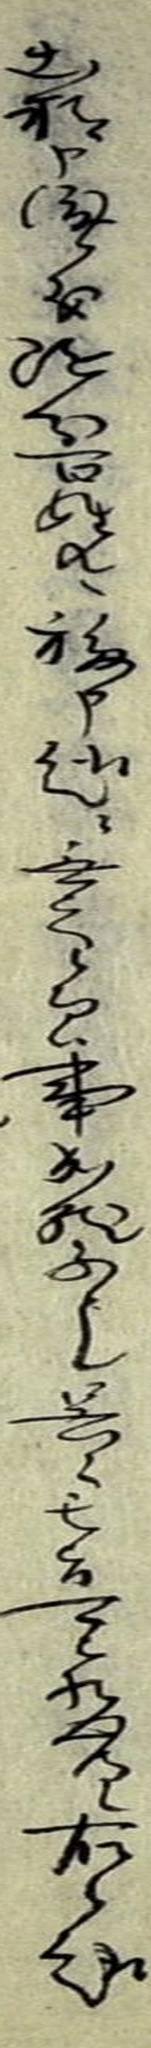出精申渡候義随分百姓共へ移申趣ニ無之候而ハ事成就不申候呉々其旨可被相心得候右之趣
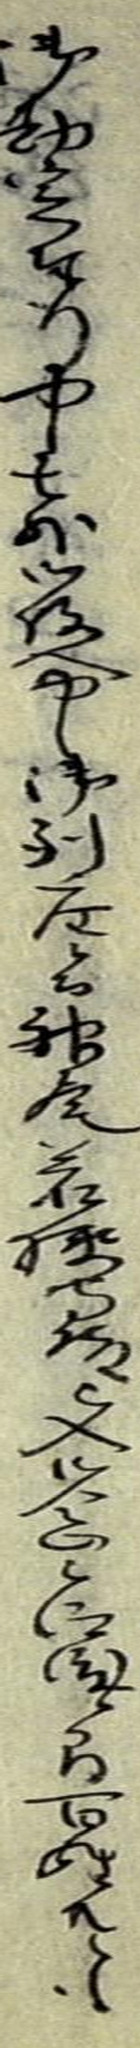御勘定奉行中其外御役人中御列座ニ而神尾若狭守殿被入御念被仰渡候間百姓共へも
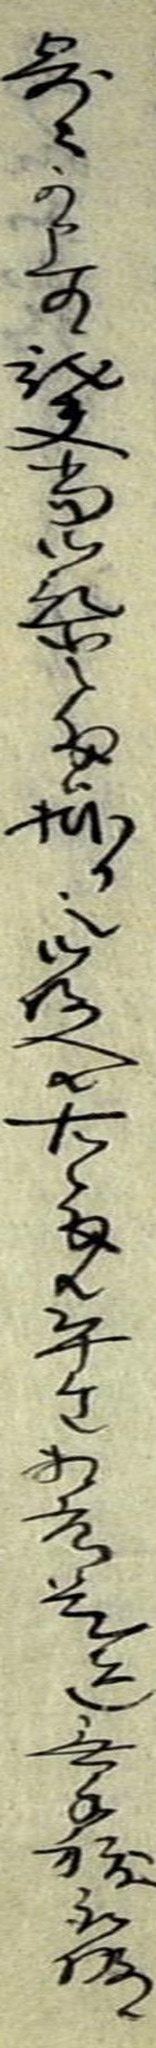寄々可申聞候就夫当御預所之義ハ掛り之御役人共右之義共平生相考是迄無手抜取扱候
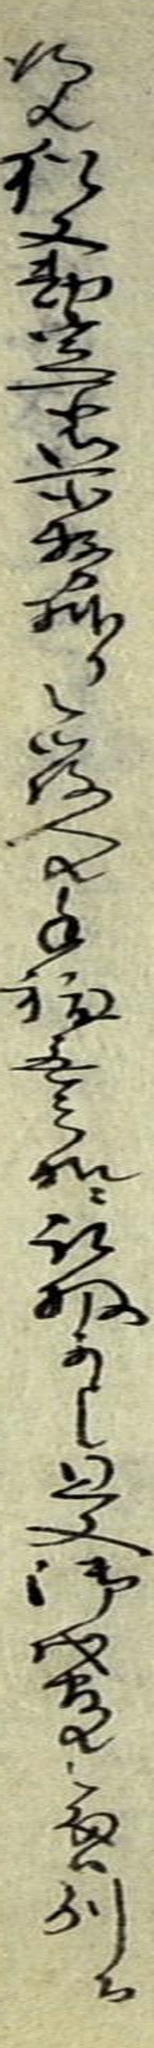得共猶又勘定所御所務掛り之御役人共手抜無之様ニ取扱可申候且又御代官共之義ハ別而
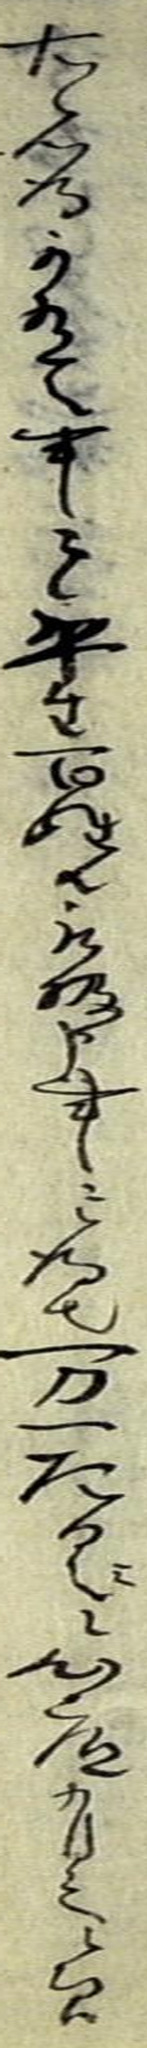右之心得可有之事ニ候平生百姓共取扱申事ニ候得者万一たるみ候心底有之候而ハ
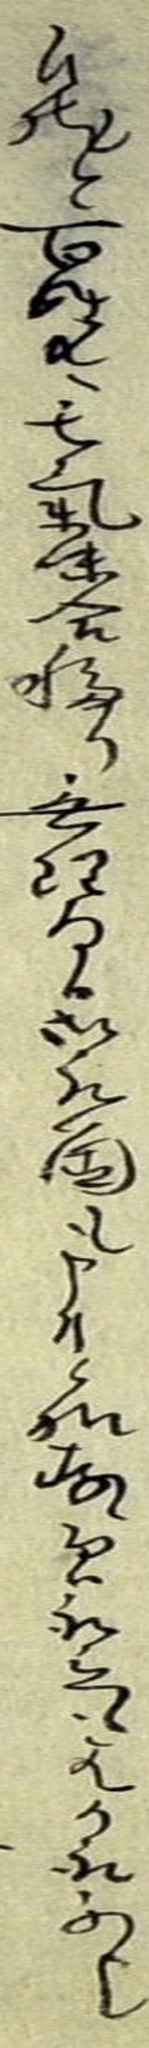自然と百姓共へ其気味合移り無理なる御取箇も申付候様存候而ハ取立もはか取不申候
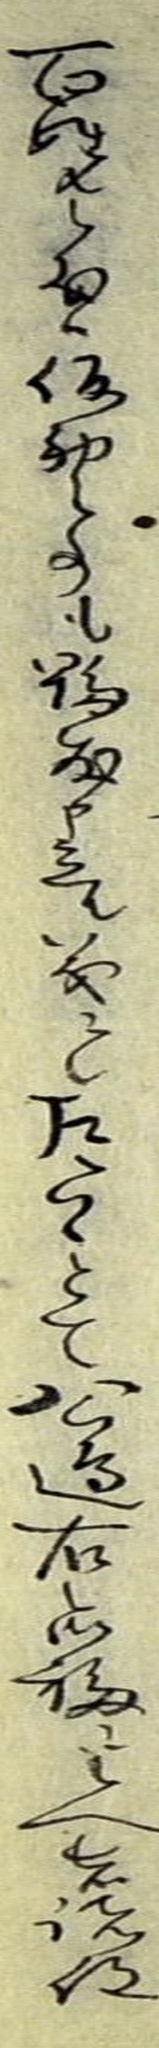百姓共之義ハ仮初之事も夥敷申立候義ニ候左候ハヽとて公辺右之御移ニ候ヘ者諸役

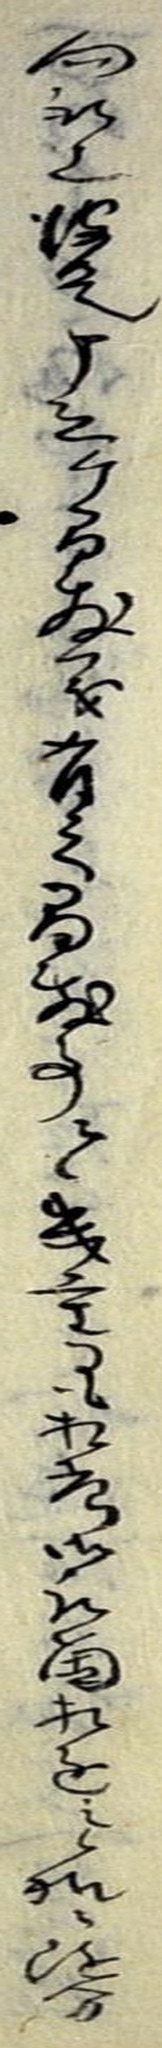向取上彼是申立ケ間敷義有之間敷事ニ候幾重にも相考御取箇相遂之候様ニ随分
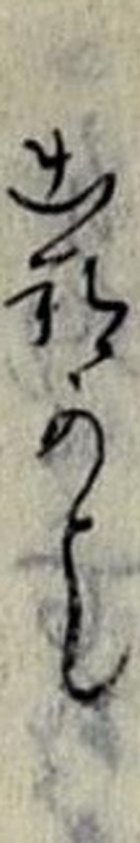出精可申候
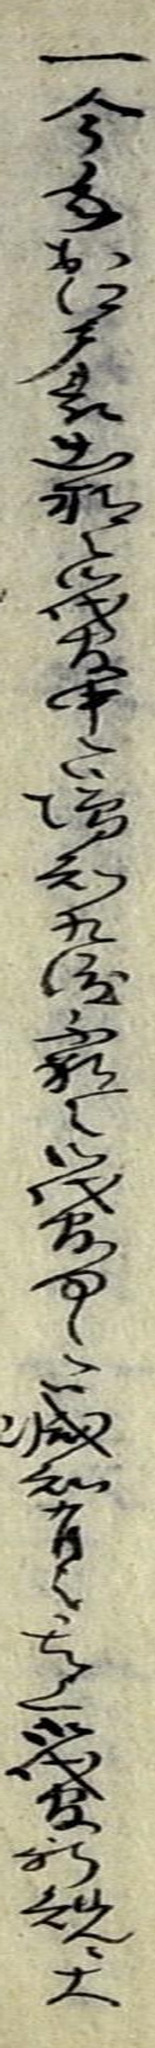一今年於江戸表出精之御代官中ヘハ増知相渡不精之御代官中ヘハ減知有之其上御代官新規ニ大
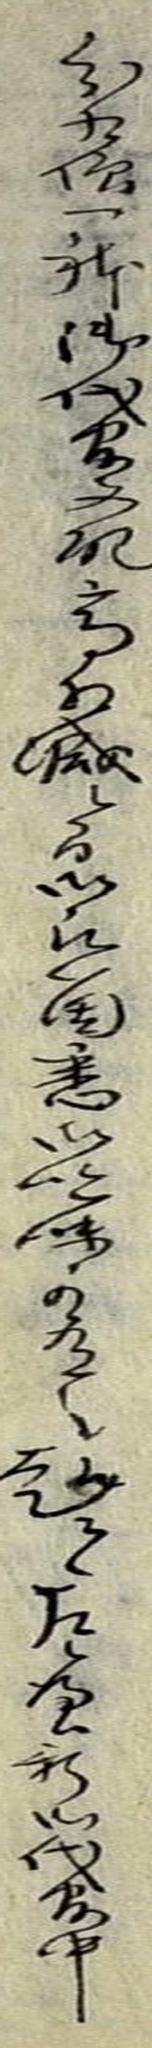分相増一体御代官支配高相減候間御取箇悉御吟味可有之趣ニ候左候得ハ新御代官中
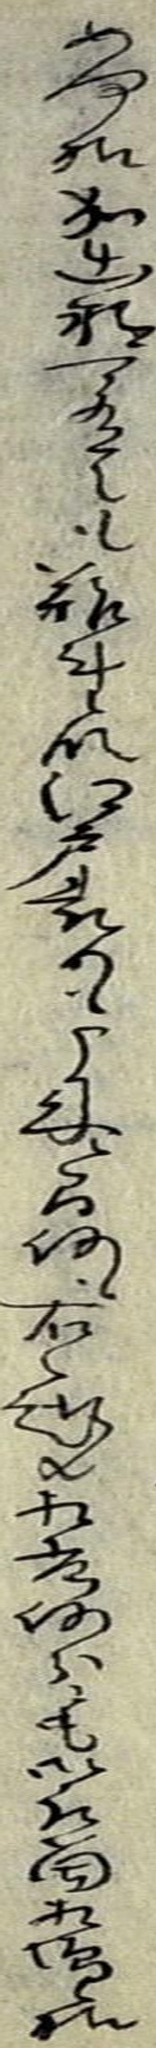如何様成出精可有之も難計候段江戸表ゟも申来候間何も右之趣共相考何分ニも御取箇相増候様
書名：命令之部 一
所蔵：福井県文書館 Fukui Prefectural Archives
